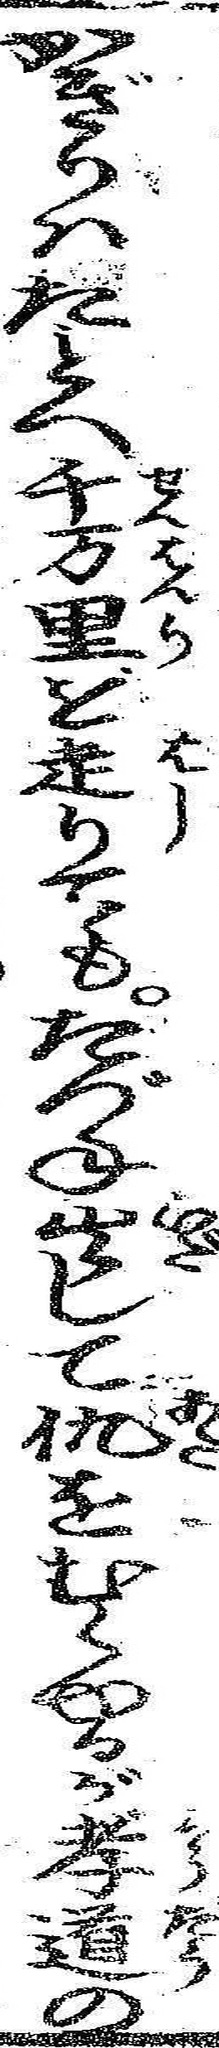かぎりはたとへ千万里を走りても。たづね出して仇をむくゆるが孝道の
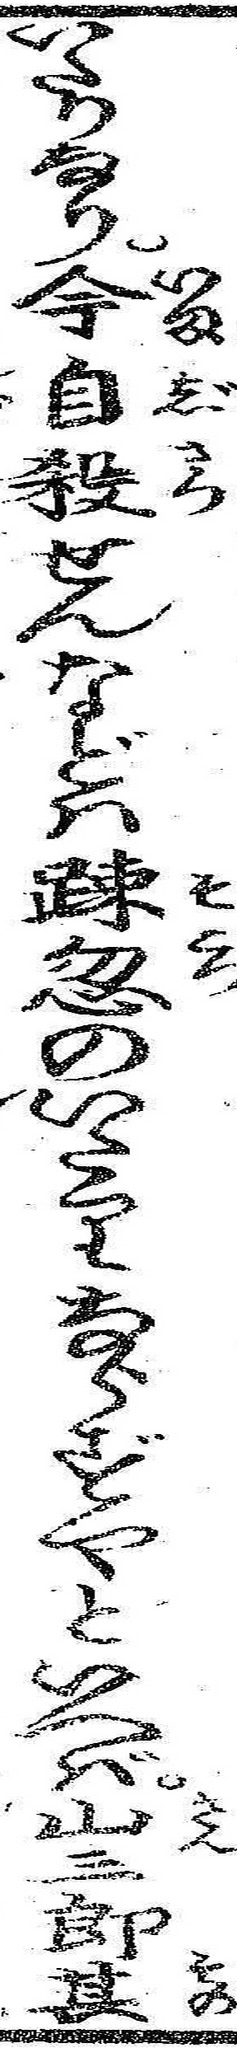いたりなり。今自殺せんなどは疎忽のいたりならずやといへば。山三郎其
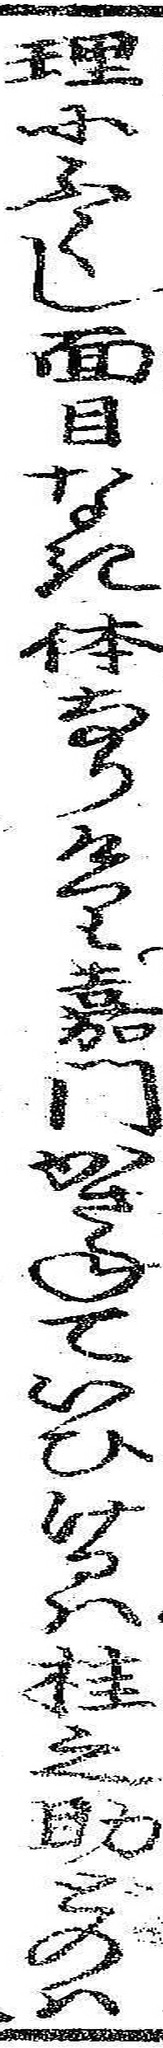理にふくし面目なき体なりけり。嘉門かさねていひけるは。桂之助どのは
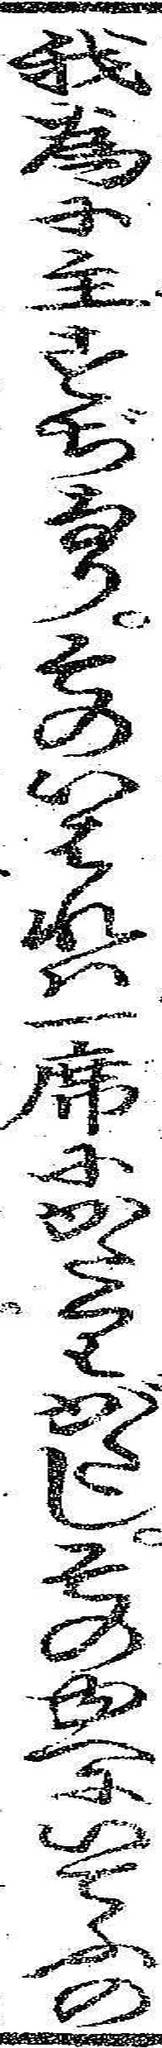我為に主すぢなり。そのいはれは一席にかたりがたし。そのゆへにいてふの
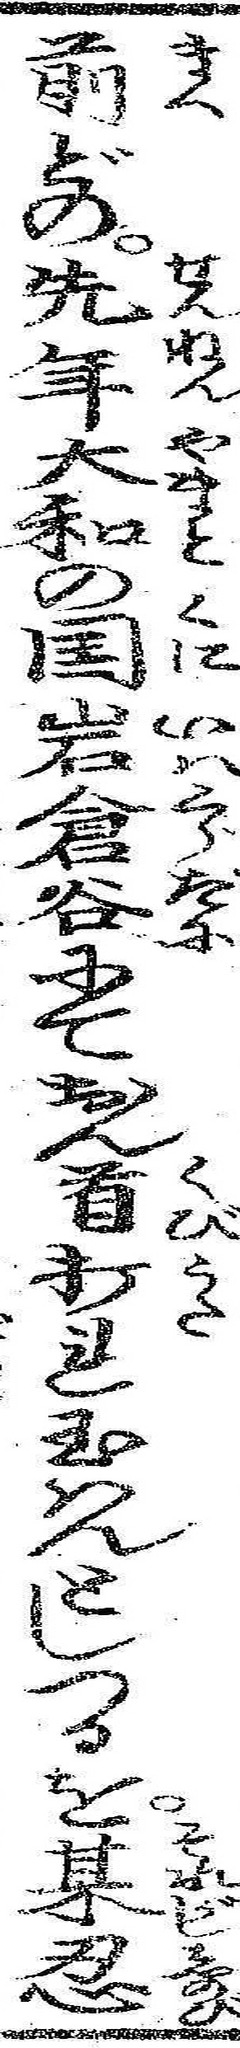前どの。先年大和の国岩倉谷にておん首打れ玉はんとしつるを。某忍
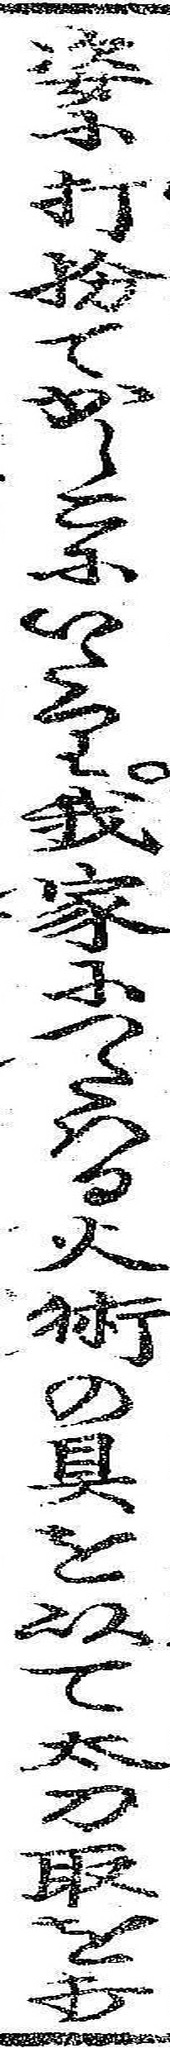姿に打扮てかしこにいたり。我家につたはる火術の具を以て太刀取を打
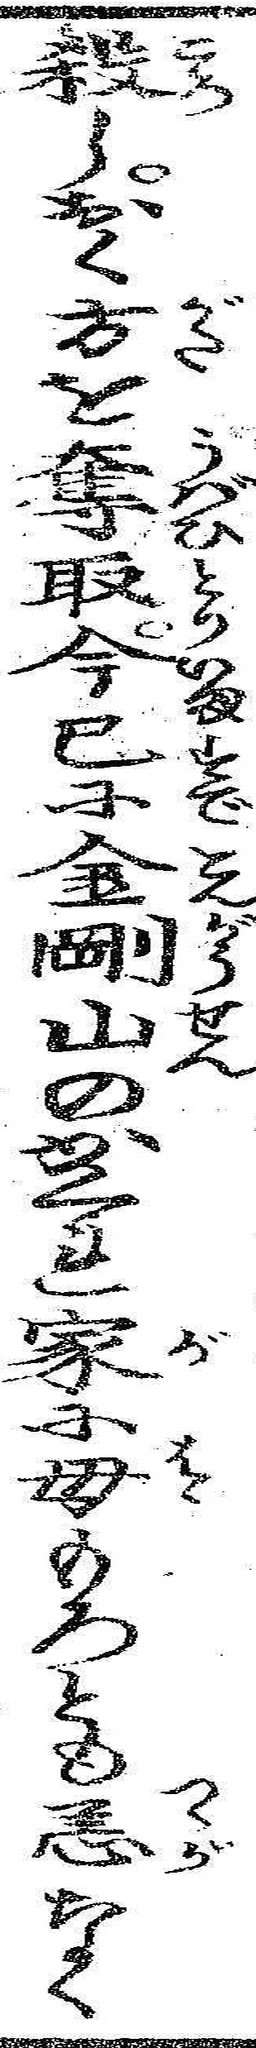殺し。おく方を奪取。今已に金剛山のかくれ家に母もろとも恙なく
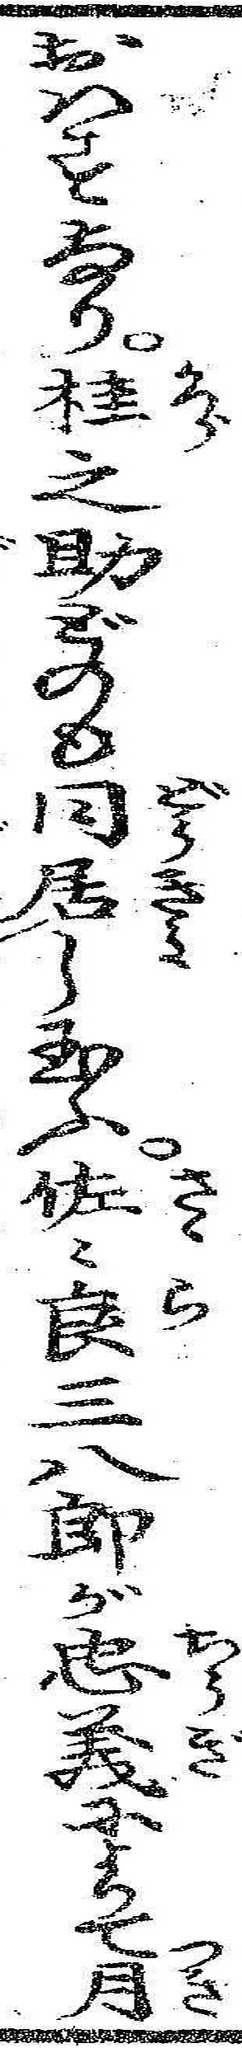おはすなり。桂之助どのも同居し玉ふ。佐々良三八郎が忠義によりて月
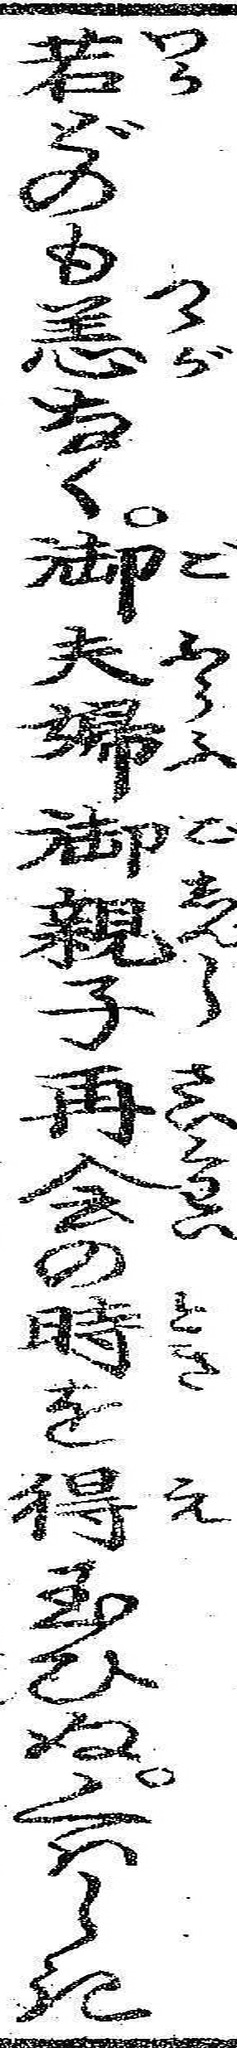若どのも恙なく。御夫婦御親子再会の時を得玉ひぬ。くはしき
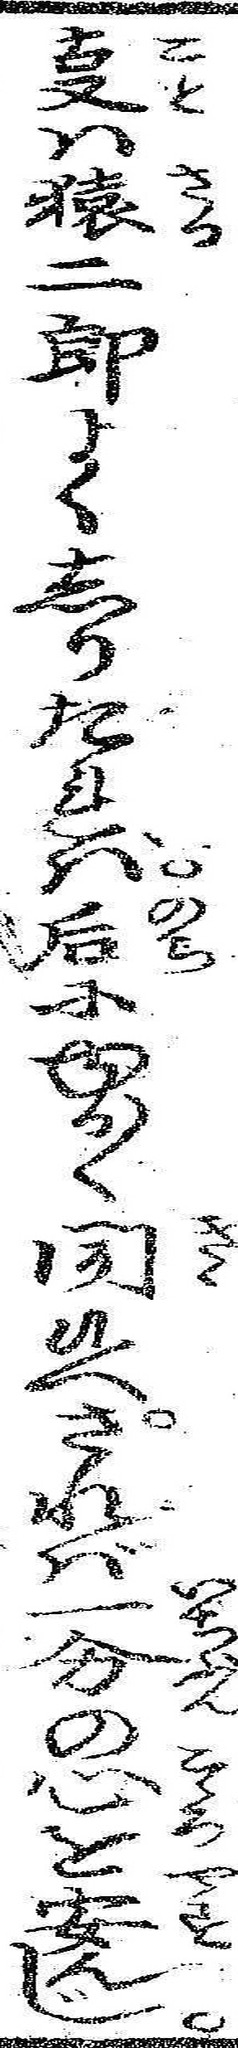事は猿二郎よくしりたれば。后にゆる〳〵聞候へ。されば一分の心を安んじ。
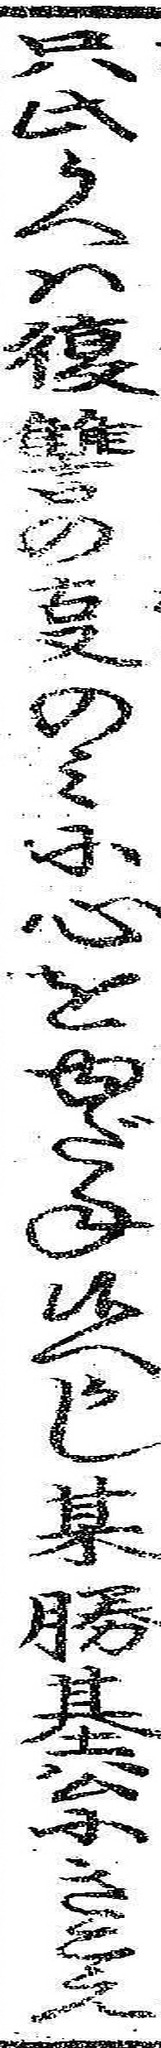只此うへは復讐の事のみに心をゆだね候へかし。某勝基公にきこえ

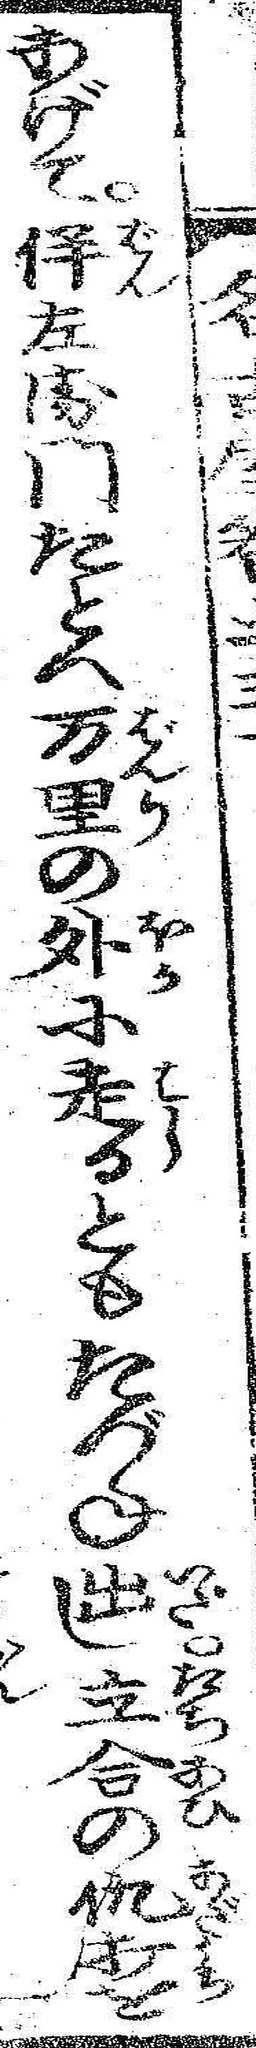あげて。伴左衛門たとへ万里の外に走るともたづね出し。立合の仇打を
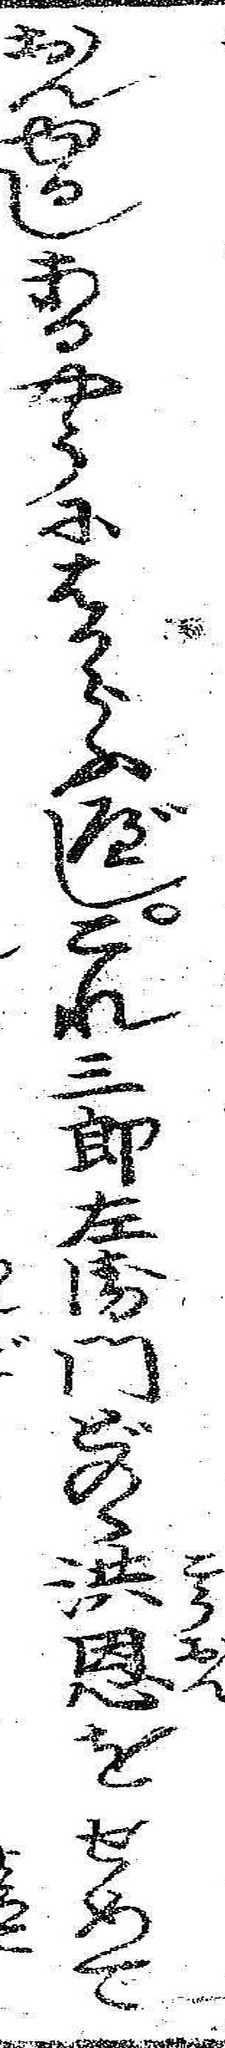おんゆるしあるやうにはからふべし。これ三郎左衛門どのゝ洪恩をせめて
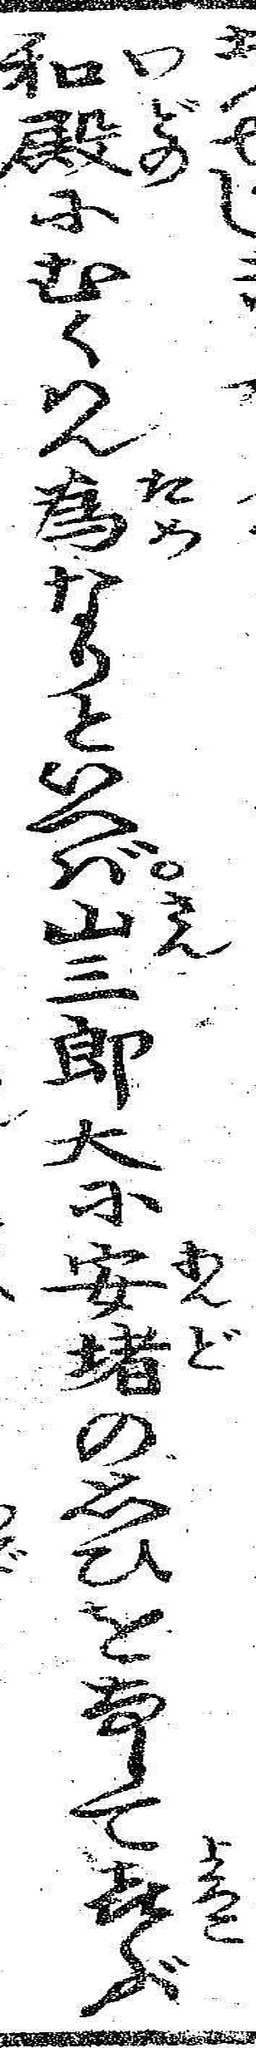和殿にむくはん為なりといへば。山三郎大に安堵の思ひをなして喜ぶ
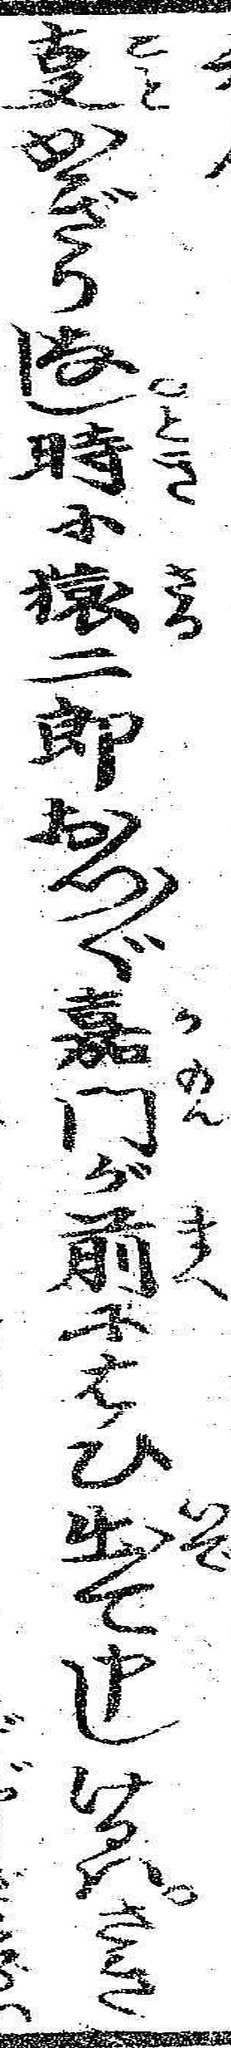事かぎりなし。時に猿二郎おつ〴〵嘉門が前にはひ出て申しけるは。さき
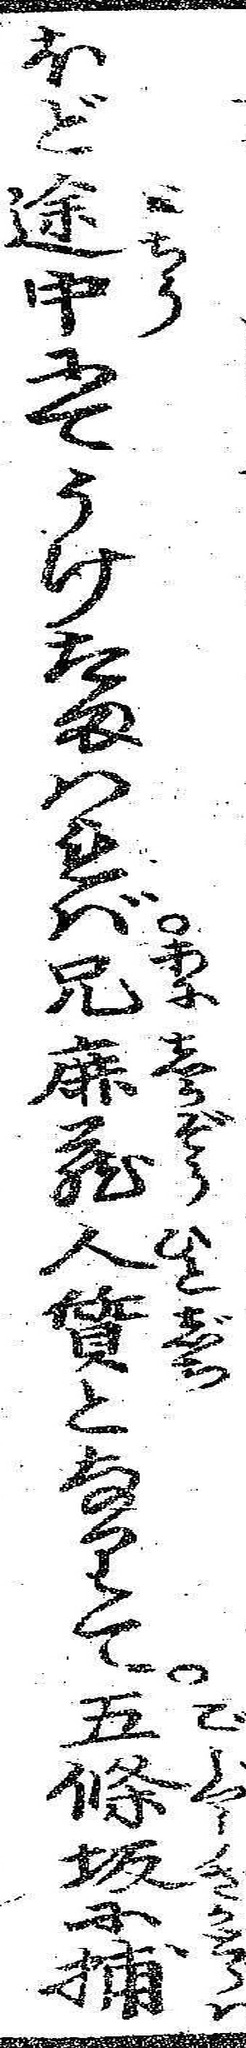ほど途中にてうけたまはれば。兄鹿蔵人質となりて。五条坂に捕
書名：昔話稲妻表紙
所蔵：国文学研究資料館
